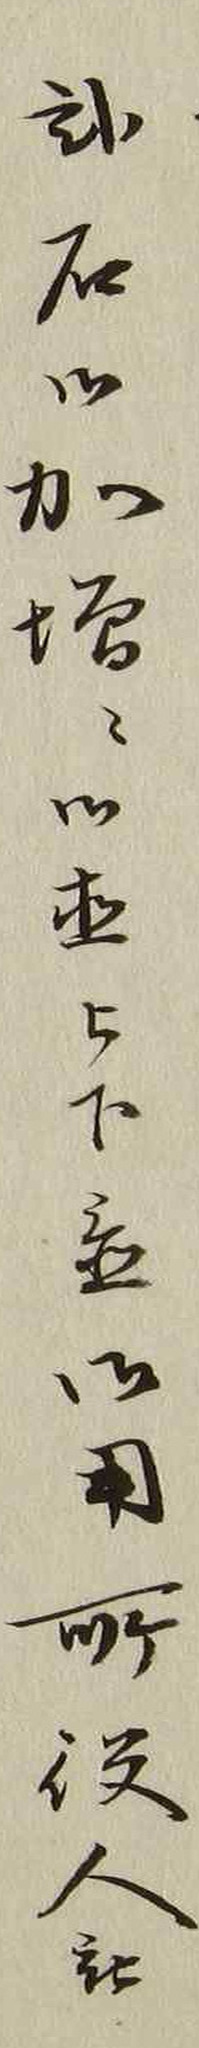弐石御加増ニ御直下し置かれ御用所役人
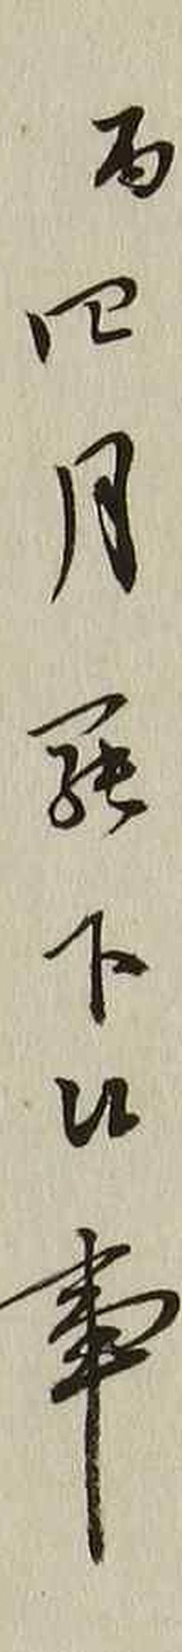酉四月罷り下り候事
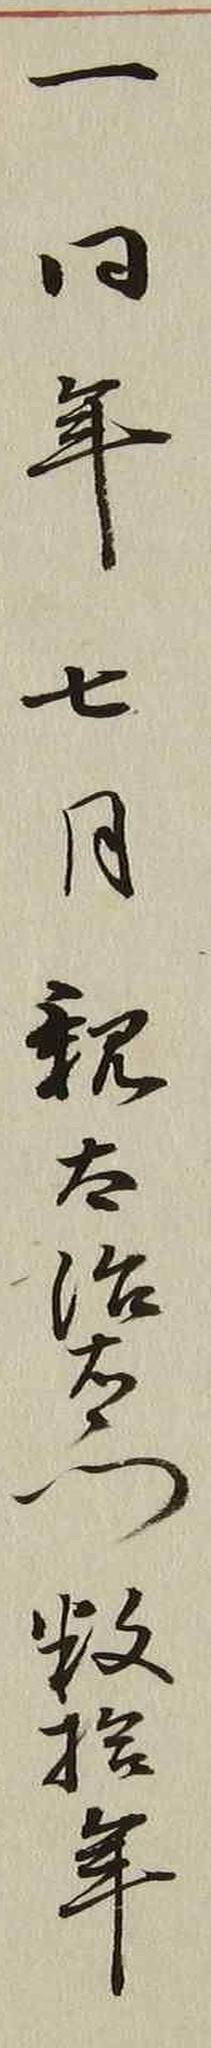一同年七月親太治右衛門数十年
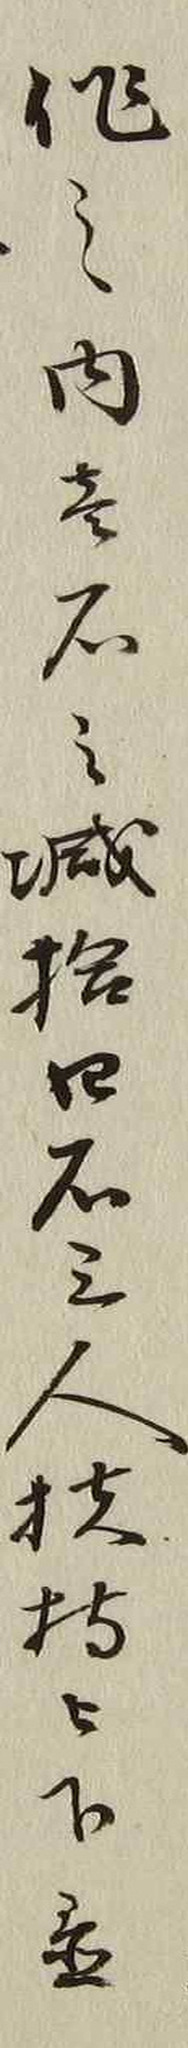作之内壱石之減拾四石三人扶持下し置かれ
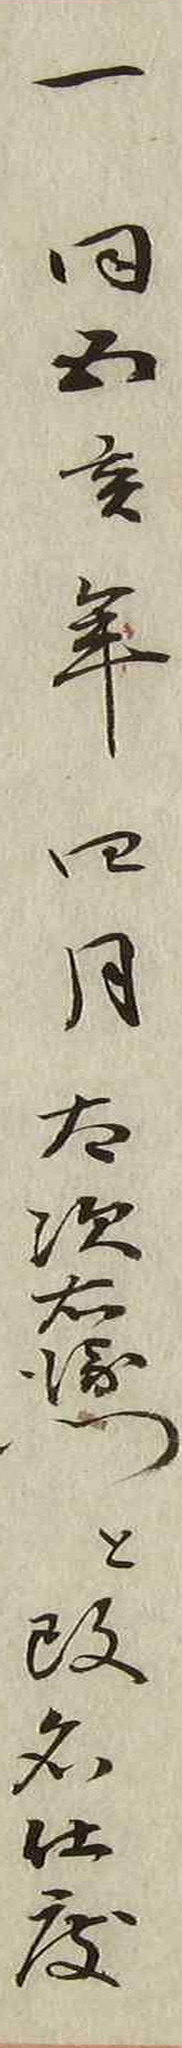一同五亥四月太治右衛門と改名仕り度
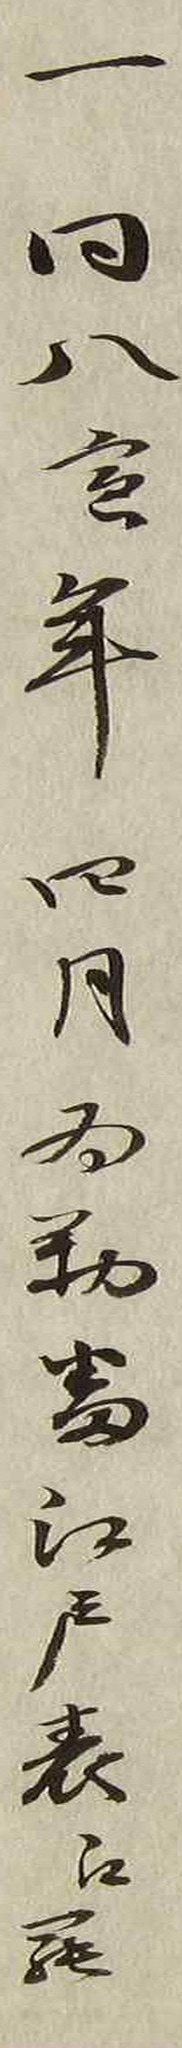一同八寅年四月勤番之為江戸表へ罷り

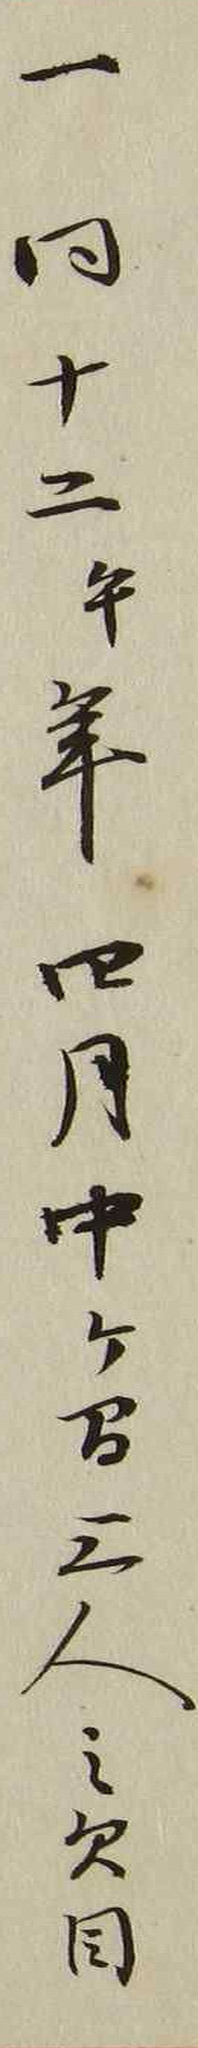一同十二午年四月中ケ間三人之欠目
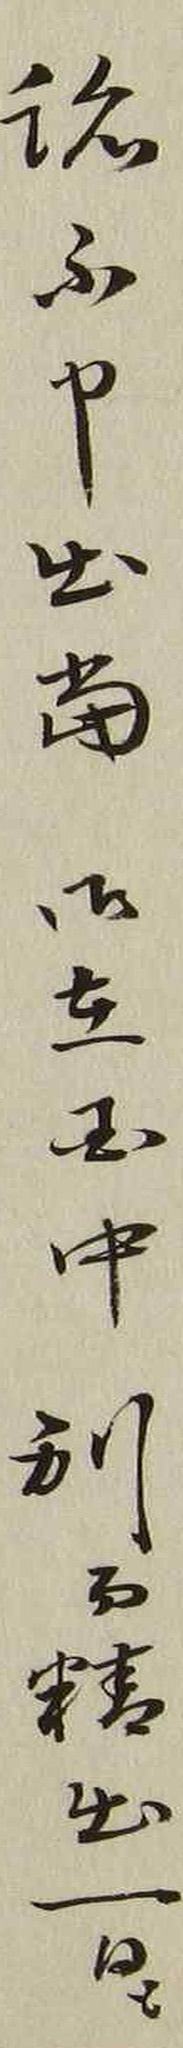諸申出ず当御在国中別して精出し一日
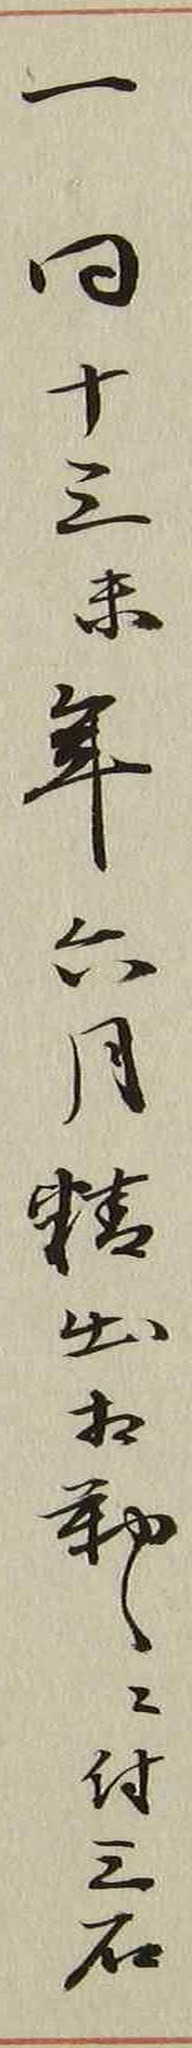一同十三未年六月精出し相勤め候ニ付き三石
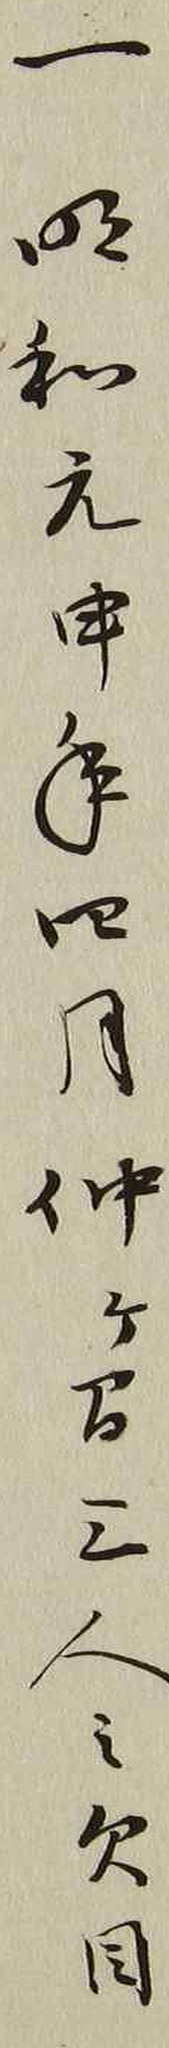一明和元申年四月仲ケ間三人之欠目
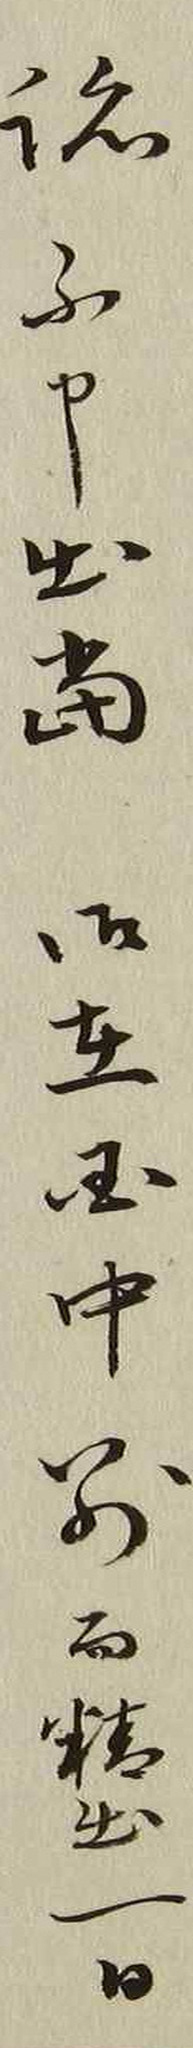諸申出ず当御在国中別して精出し一日
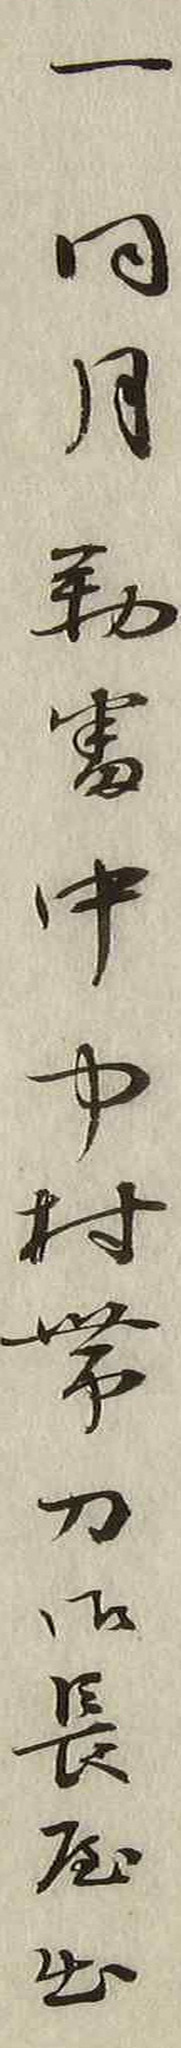一同月勤番中中村帯刀御長屋出
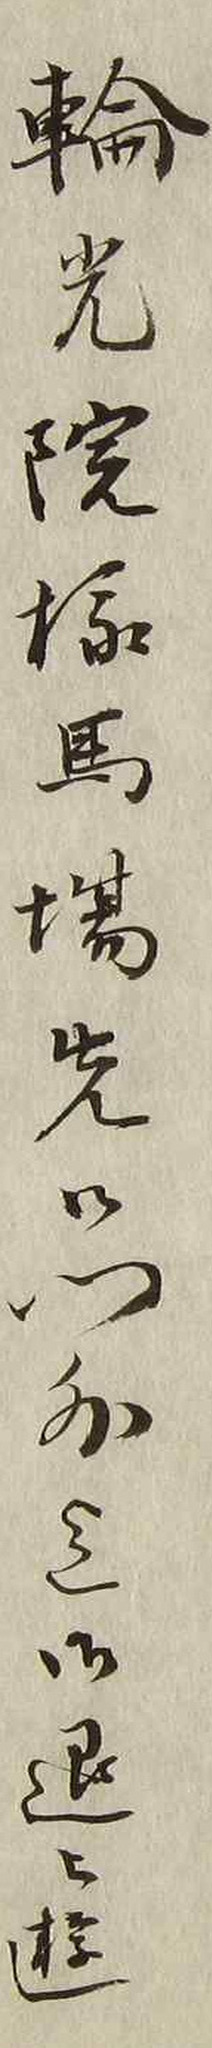輪光院様馬場先御門外迄御退遊ばされ
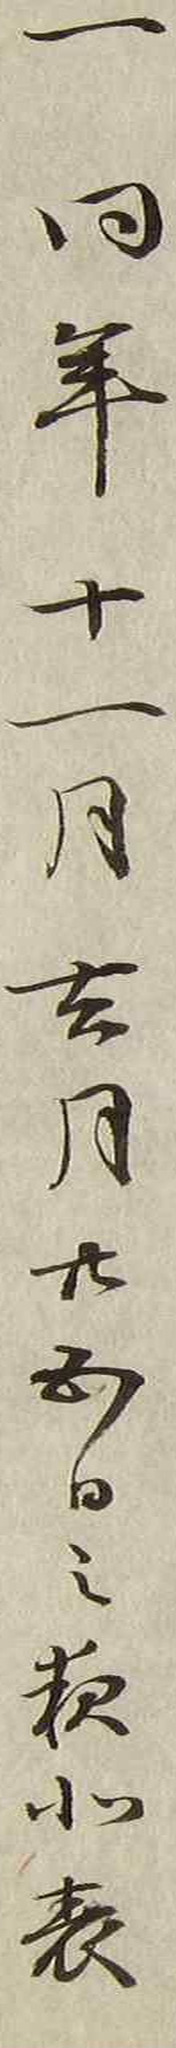一同年十一月去月廿五日之夜北表

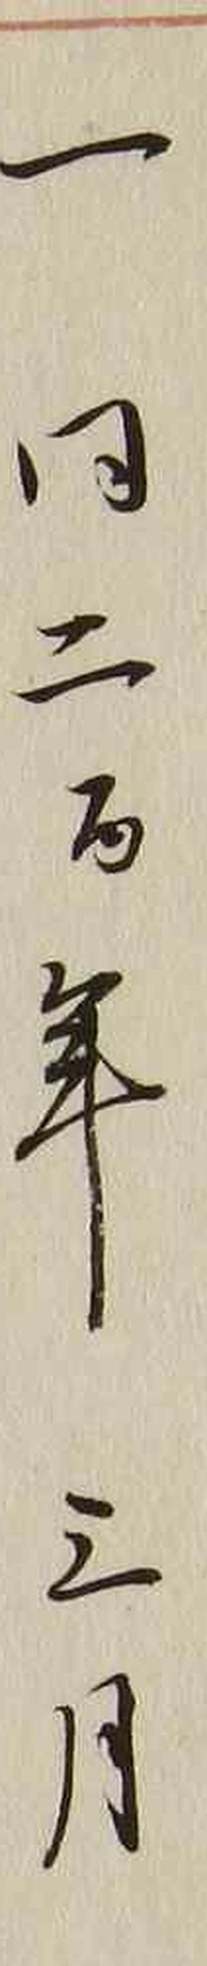一同二酉年三月
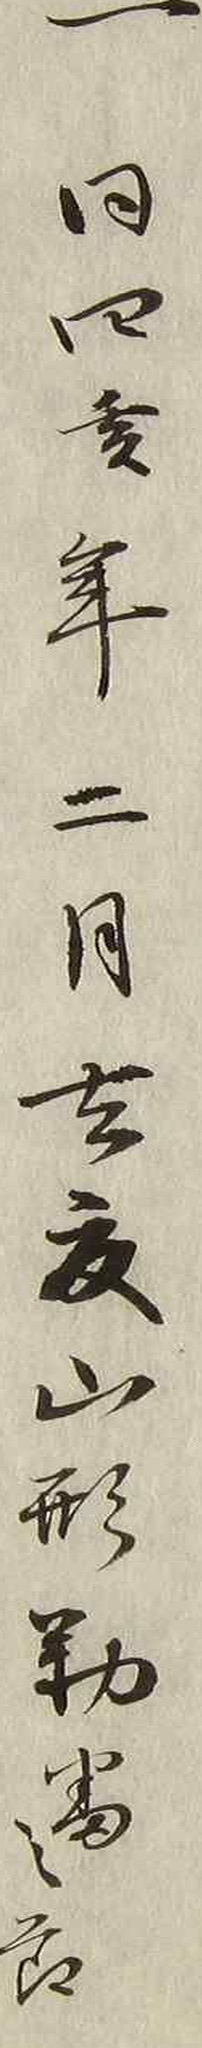一同四亥年二月去る夏山形勤番之節
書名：諸士系譜　巻之16　い之部16
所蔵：会津若松市立会津図書館
